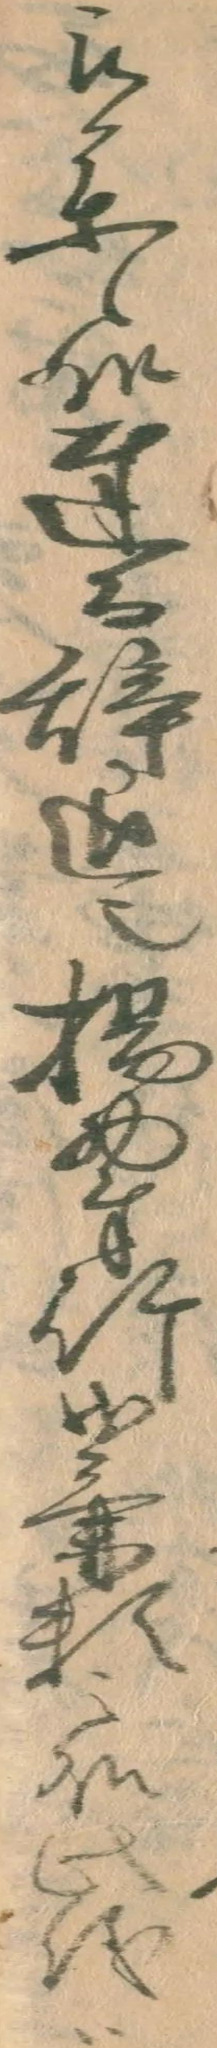被参候処達而辞退也揚物奉行御兼頼之処此儀ハ
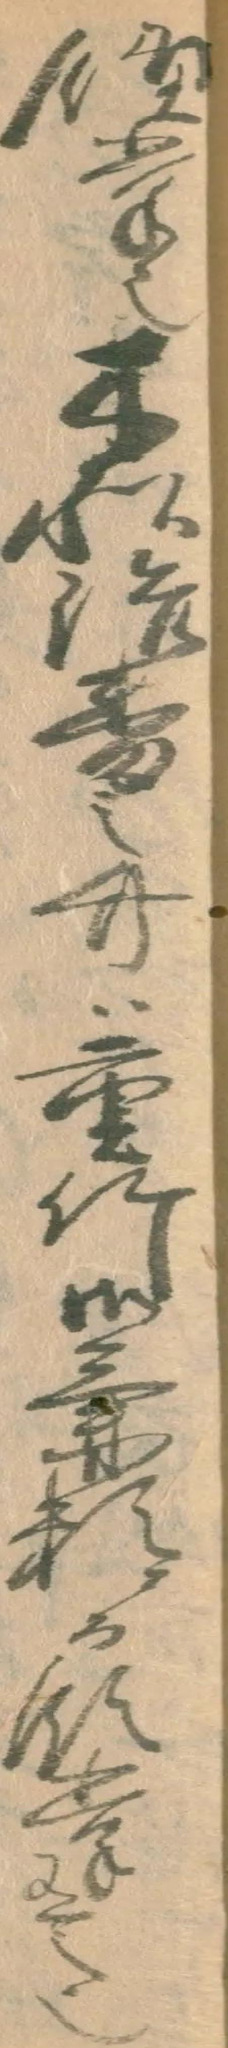領掌也木船詰番之介ハ重竹御兼頼ニ而領掌有之也
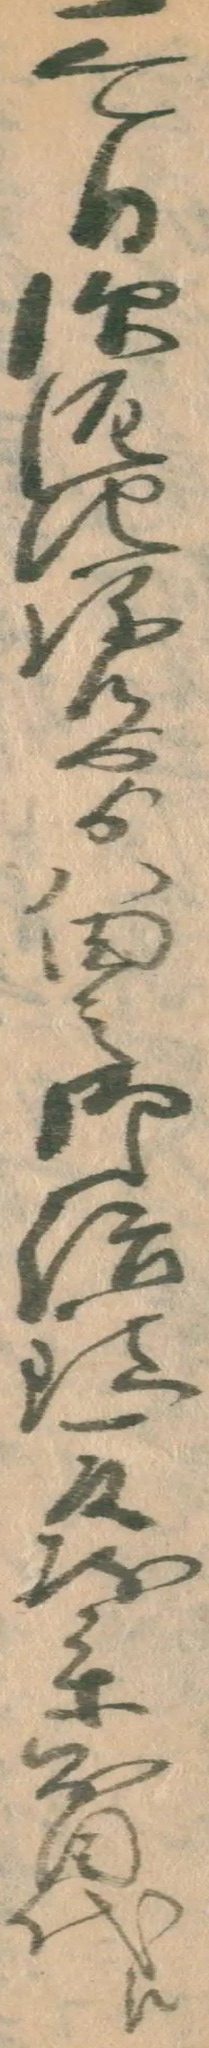一今日深泥池弥左衛門ゟ八田之御結鎮一反持参別目代江
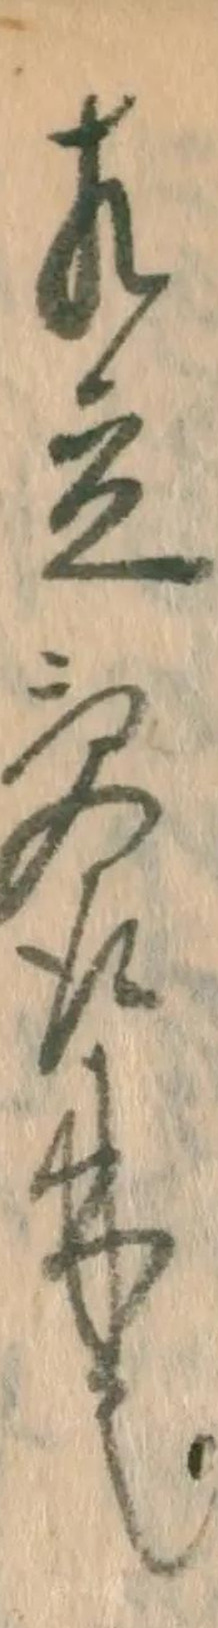相立受取来也
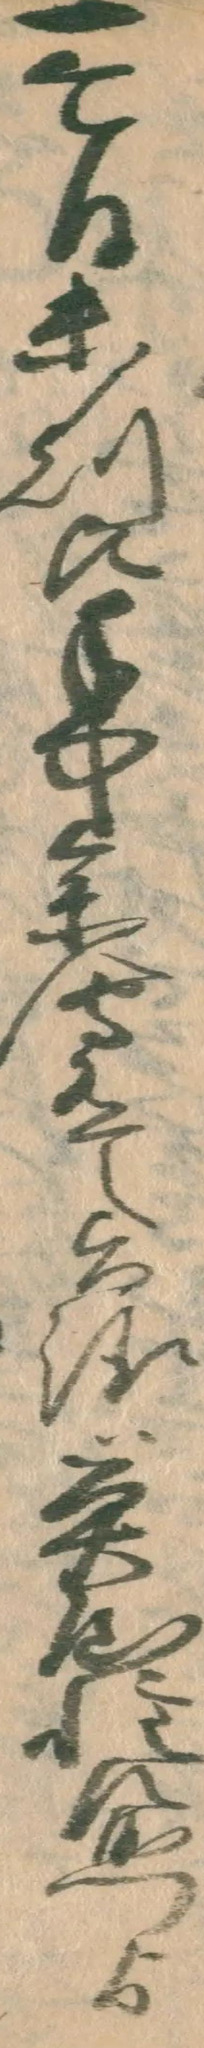一今日未刻比手中参会有之旨趣ハ魚屋権左衛門ゟ
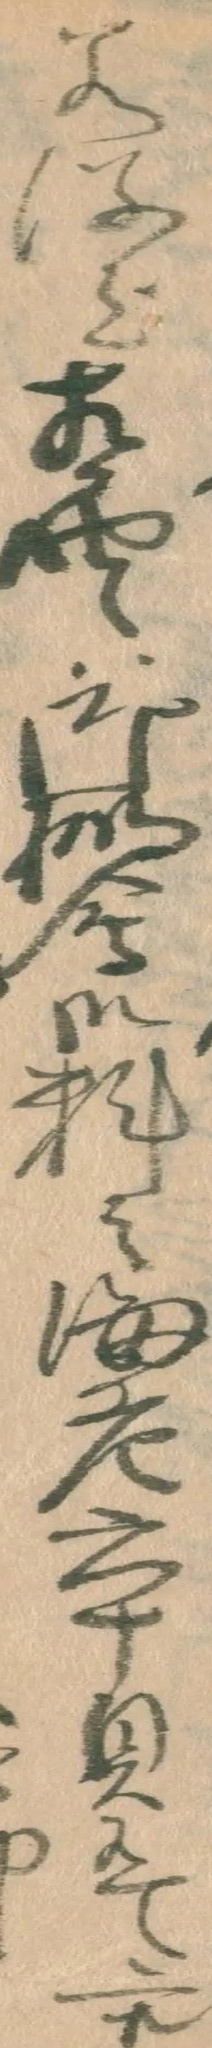若役迄相届候ハ御棚会御料之海老六十具有之候へ共
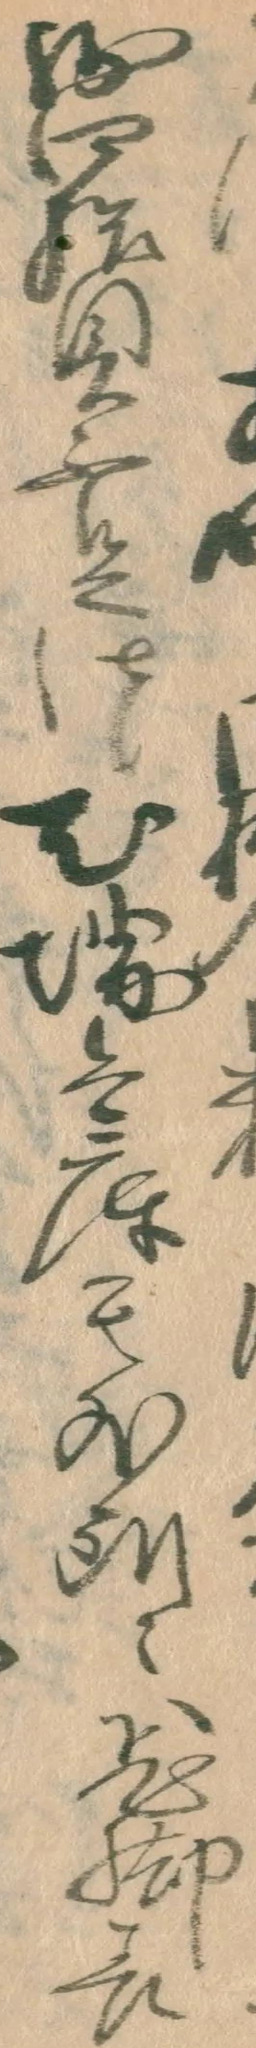残四拾具不足仕候玉塚？兵庫其外所々へ飛脚差
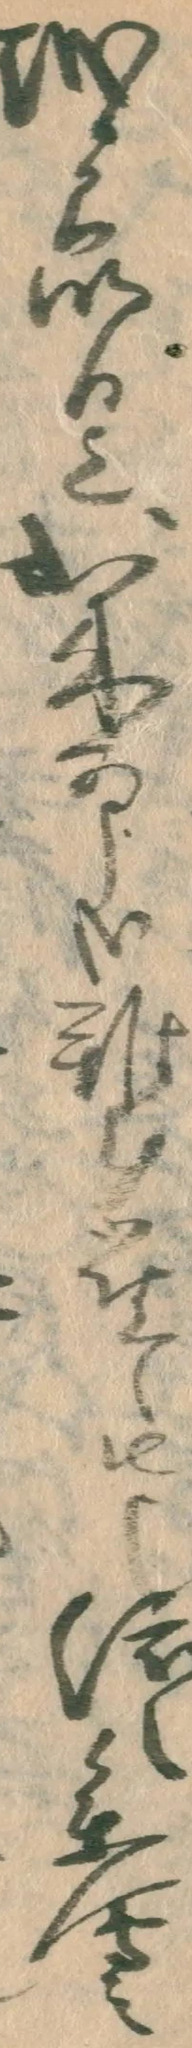越候間明日迄出来可申哉難計御座候由申候依之参会之
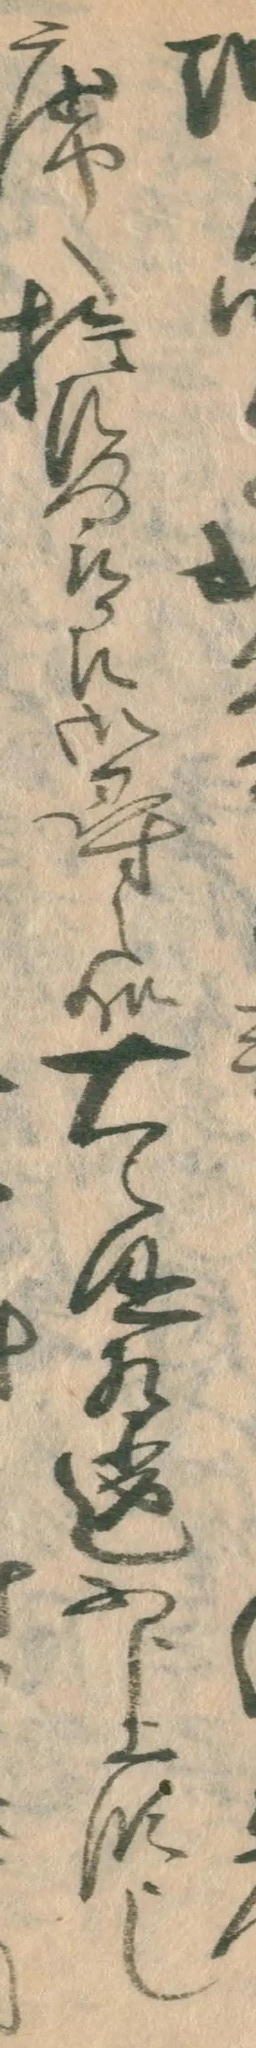席へ権左衛門被召御尋候処右之通相違不申上段申候
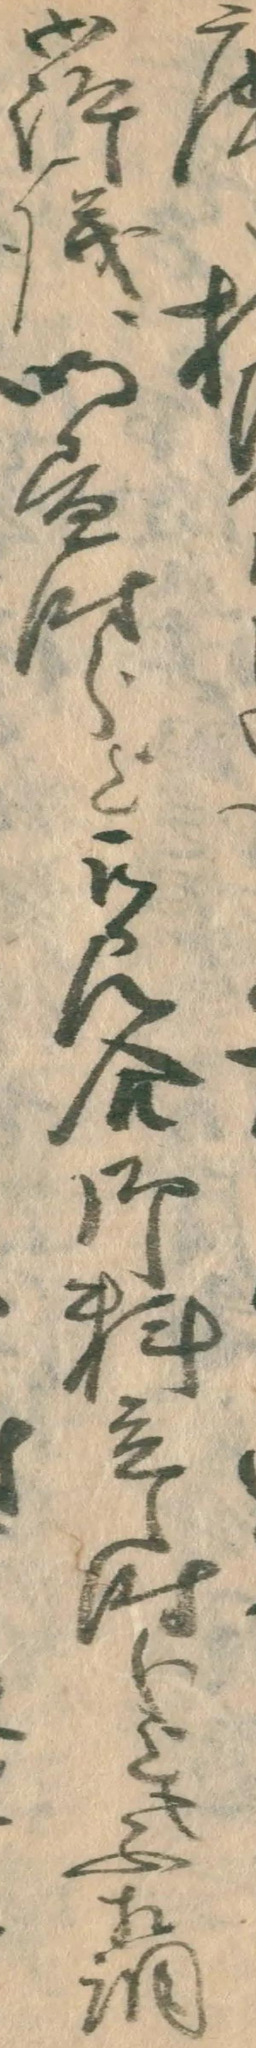御評儀ニ明昼時分迄被見合御料立之時分迄も不相調
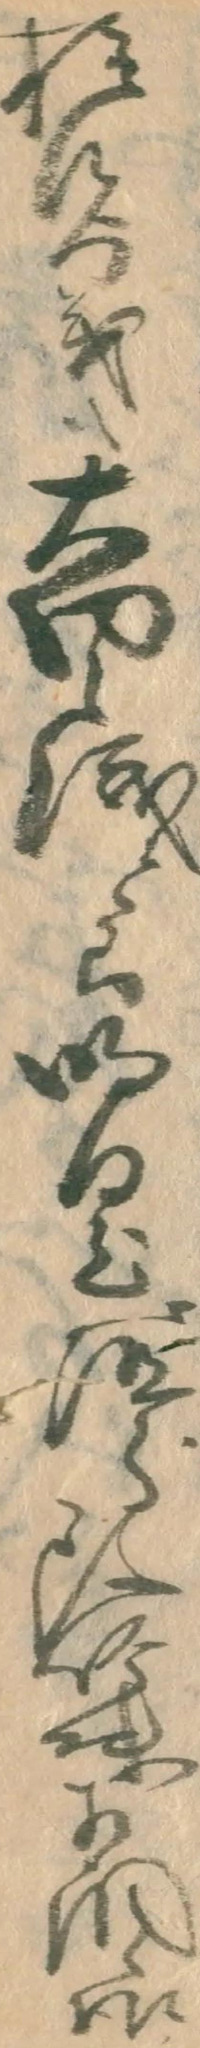権左衛門義も大切之儀ニ候間明日迄ニ随分致吟味相調候様

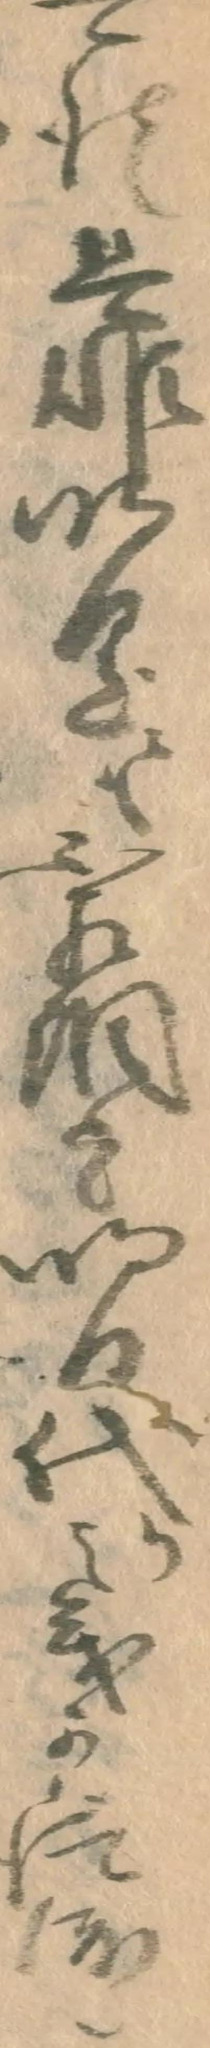可仕候是非明日迄ニも不相調候ハヽ明日代り之義可被仰渡候
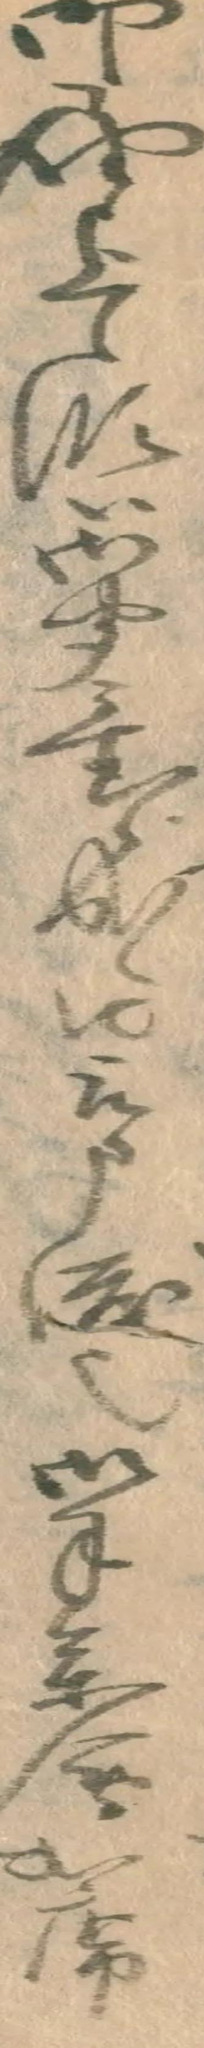御届申上候段ハ御聞置被成候由被申渡也御手参合出席
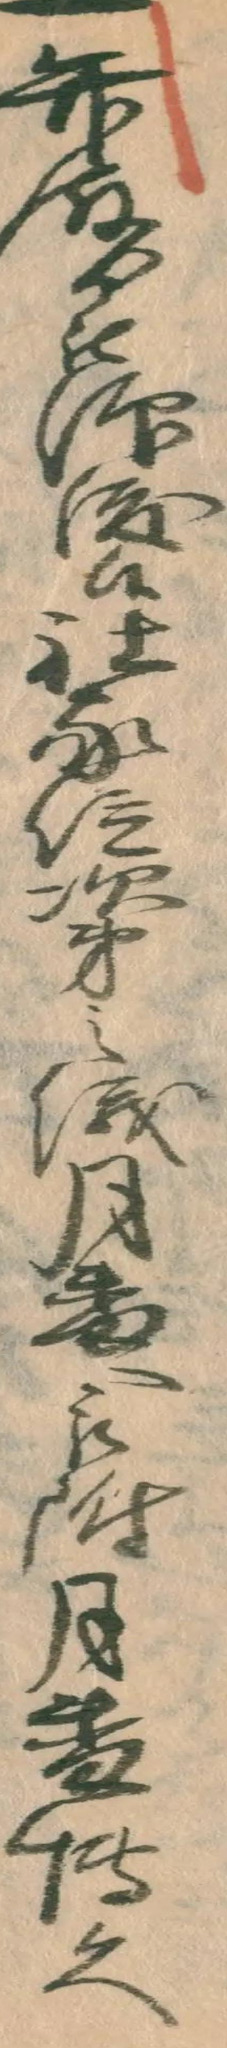一弁殿ゟ被仰渡候社家位次第之儀月番へ被附月番博久
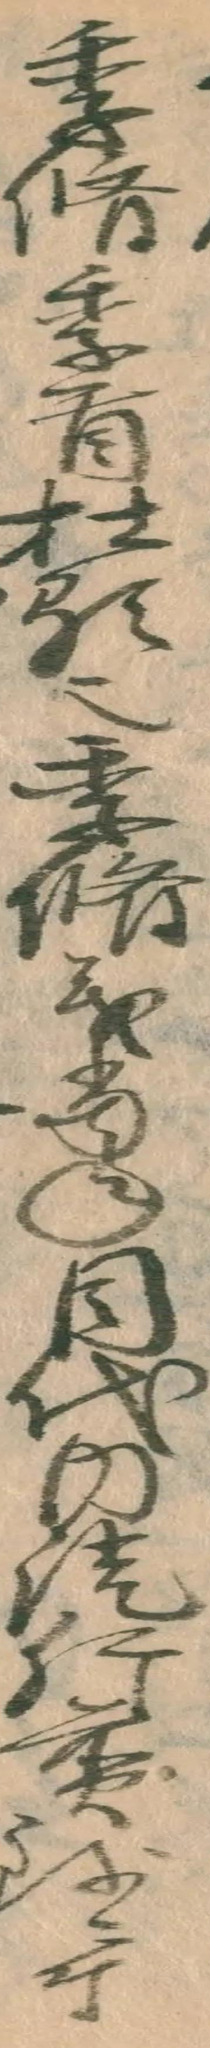季脩季首杜顕也季脩義当年目代内証肝煎致ニ付
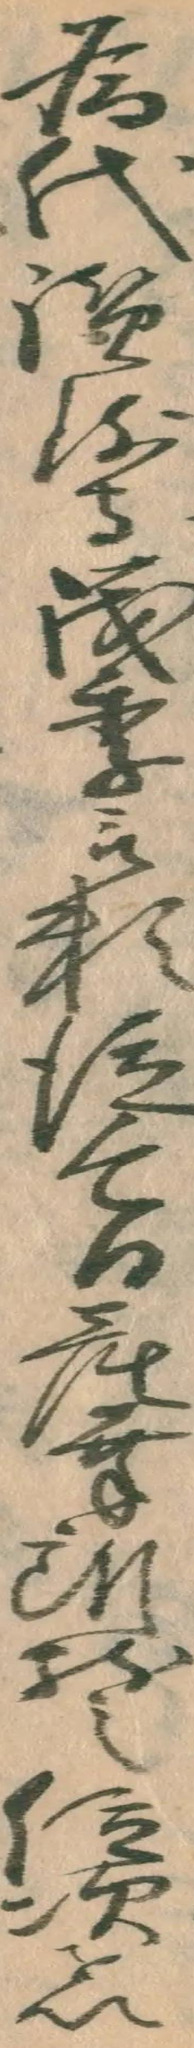為代讃岐守茂季被頼従今日産幸所持之位次を以
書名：賀茂社記録. 第60冊
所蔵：国立国会図書館 National Diet Library, JAPAN
